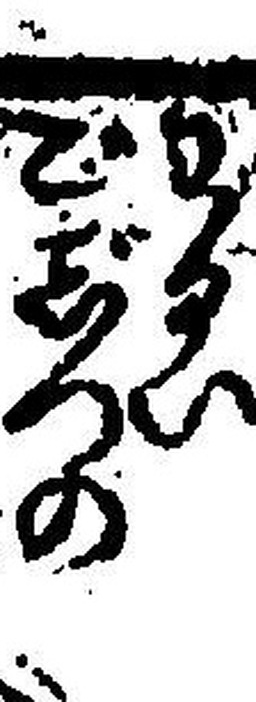ごじつの
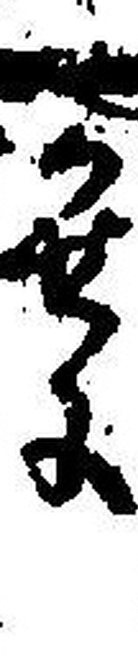かせに
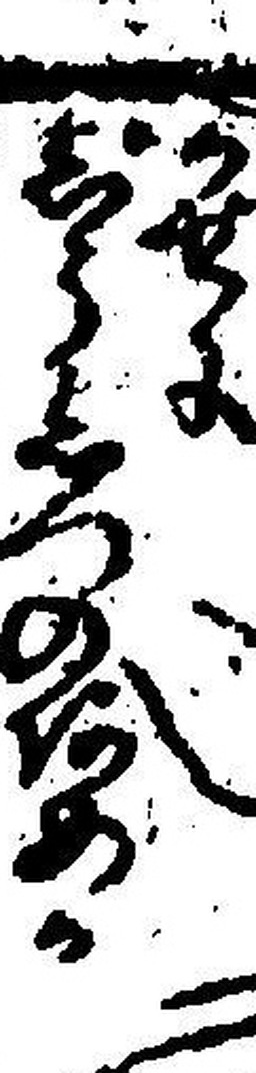じうしつのあめか
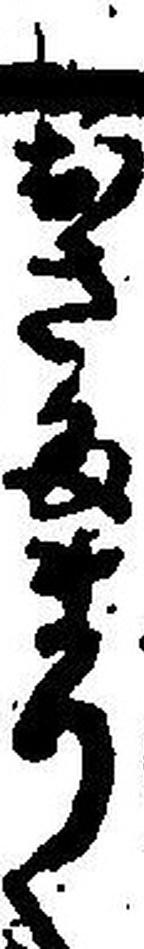おさたまり
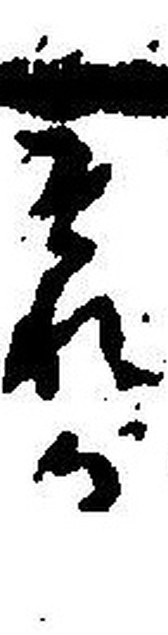それが
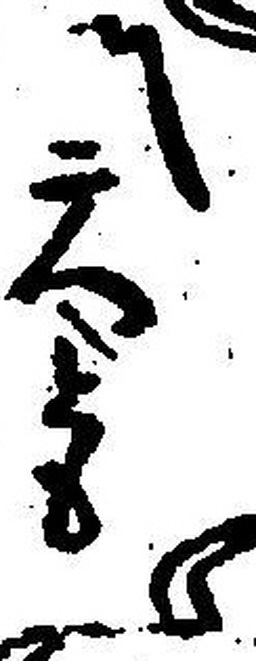〽二人とも
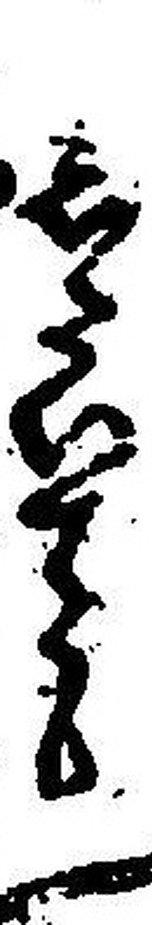したいても
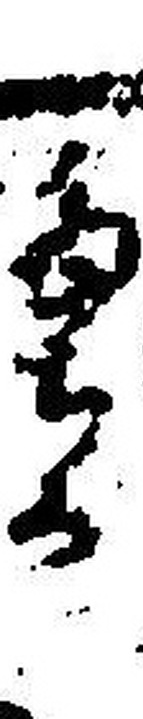たちか
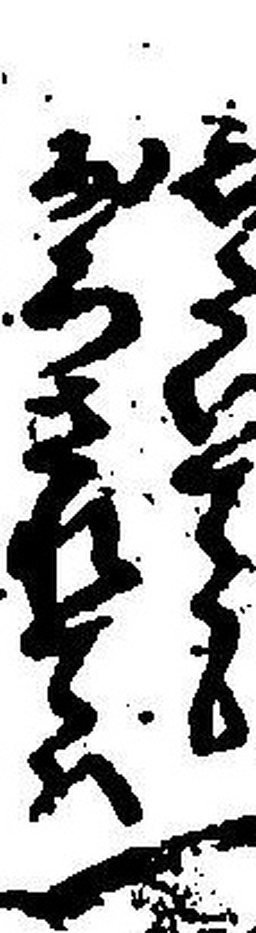おろされては
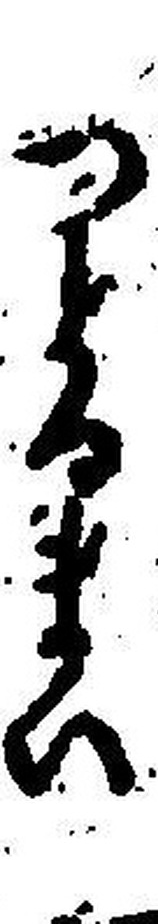つまるまい
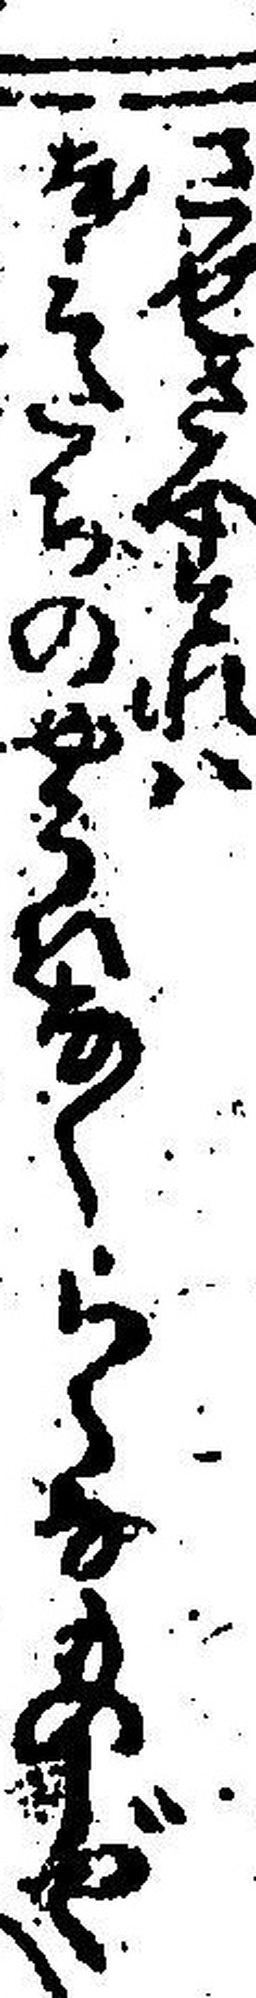ほかになみたちのやういなくらくなものじや
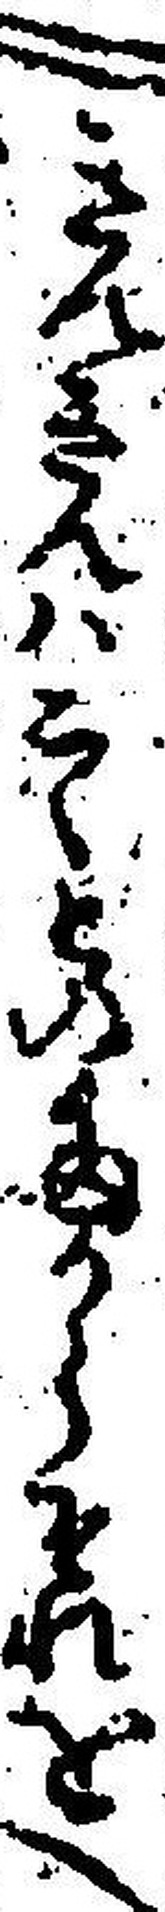事にきんきんはこくとのたからそれを
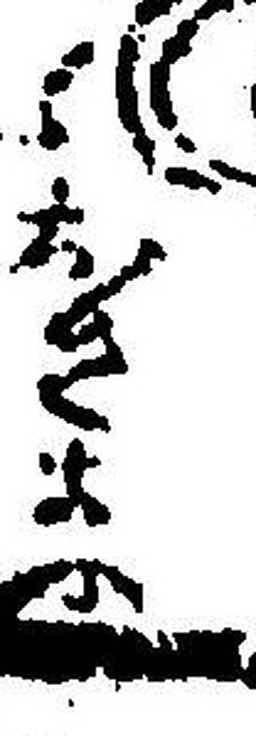おさよふ
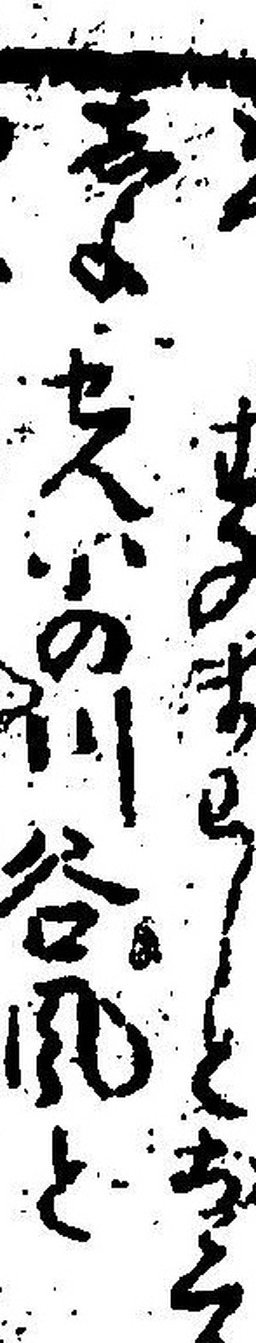しよせん小の川谷風と
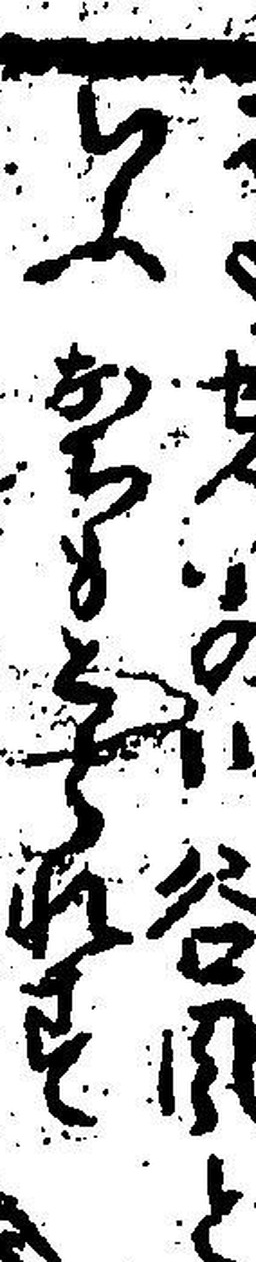いふおちもとられす
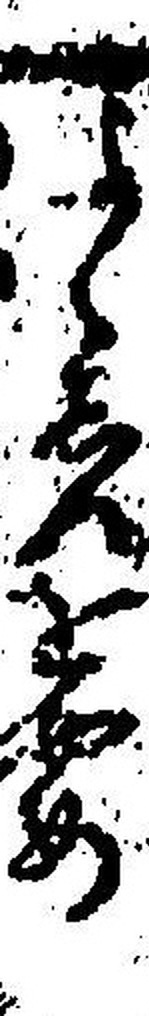よくしんをやめ
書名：天竺儲之筋 / 市場通笑作
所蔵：東京大学総合図書館 General Library in the University of Tokyo, JAPAN
